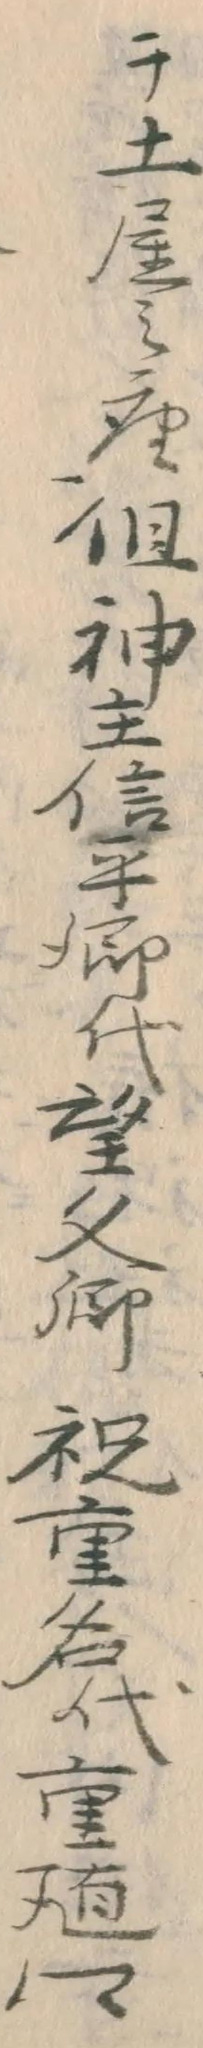于土屋之座但神主信平卿代望久卿祝重名代重殖卿
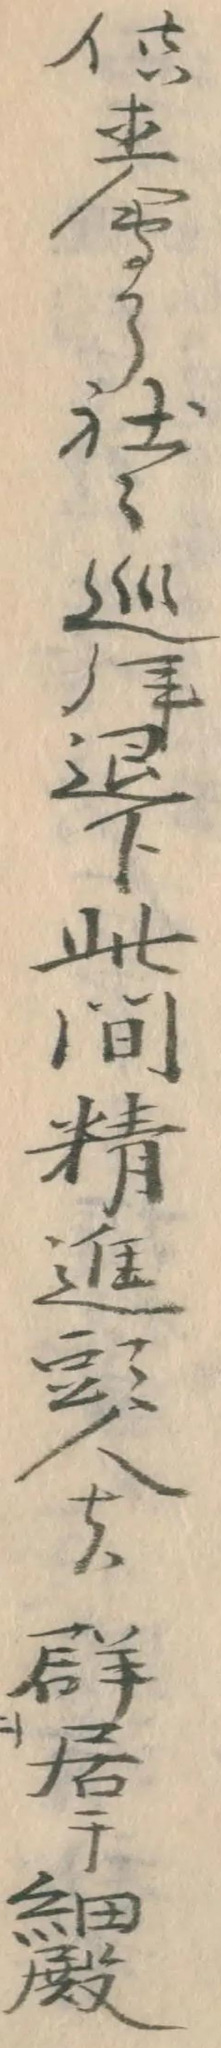供直會了社〻巡拝退下此間精進頭人は群居于細殿

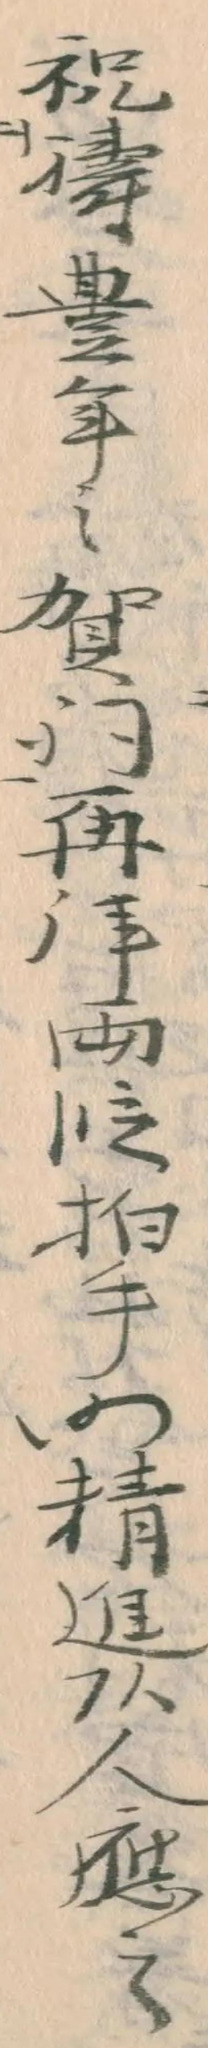祝祷豊年之賀詞再拝両段拍手仍精進頭人應之
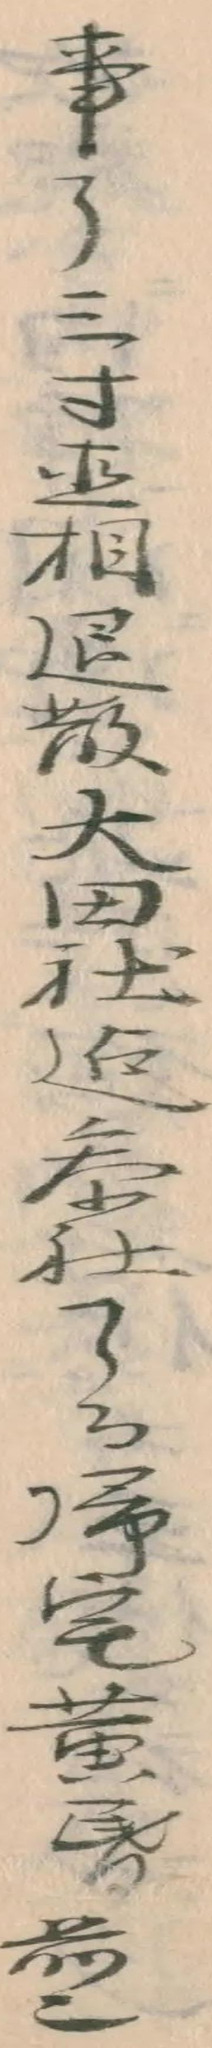事了三寸直相退散大田社迄参社了而帰宅黄昏前也
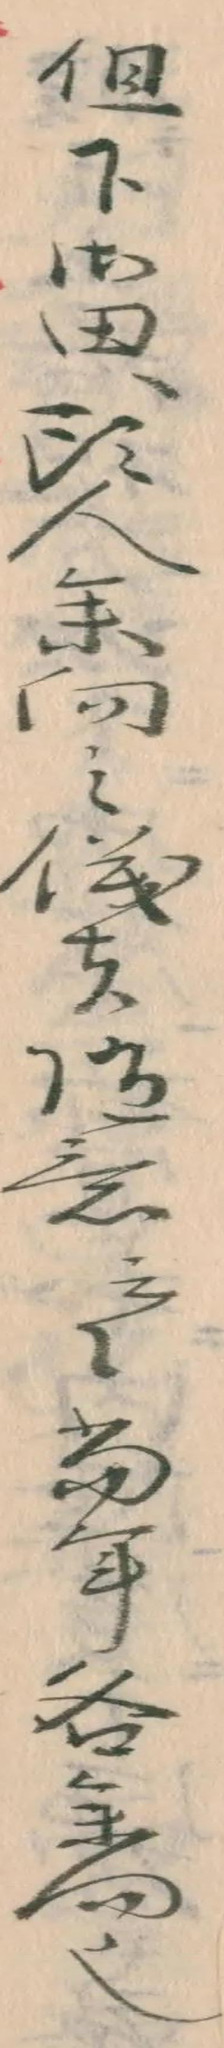但下御田へ頭人参向之儀は随意云々當年各参向也
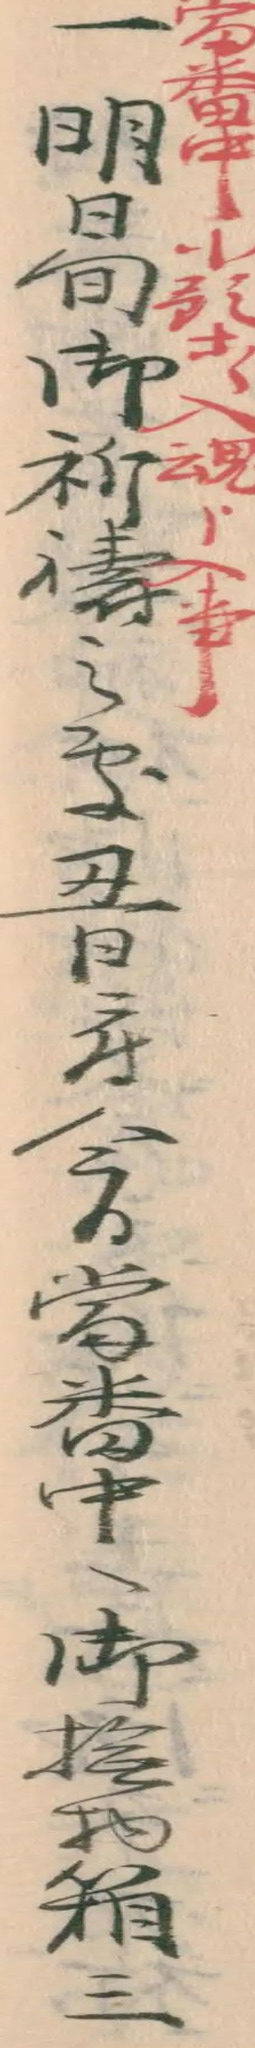一明日旬御祈祷之處丑日ニ付今日當番中へ御捨物箱三
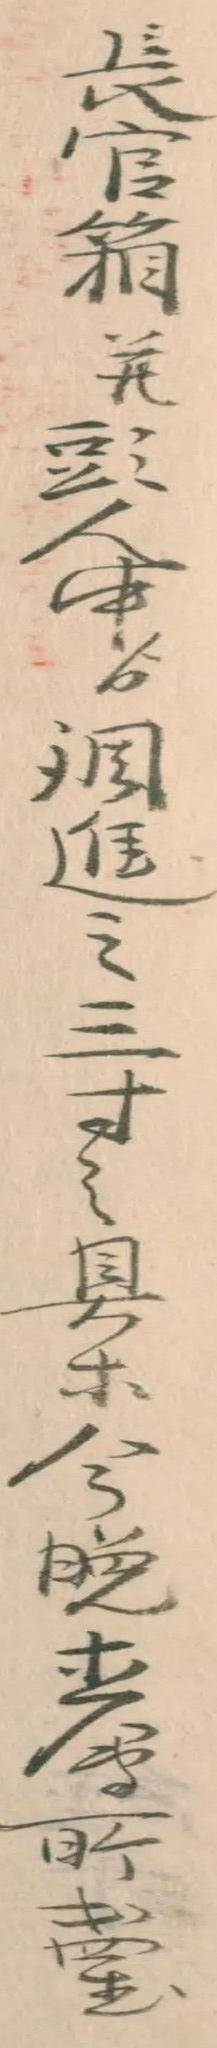長官箱幷頭人中ゟ調進之三寸之具等今晩直會所出置
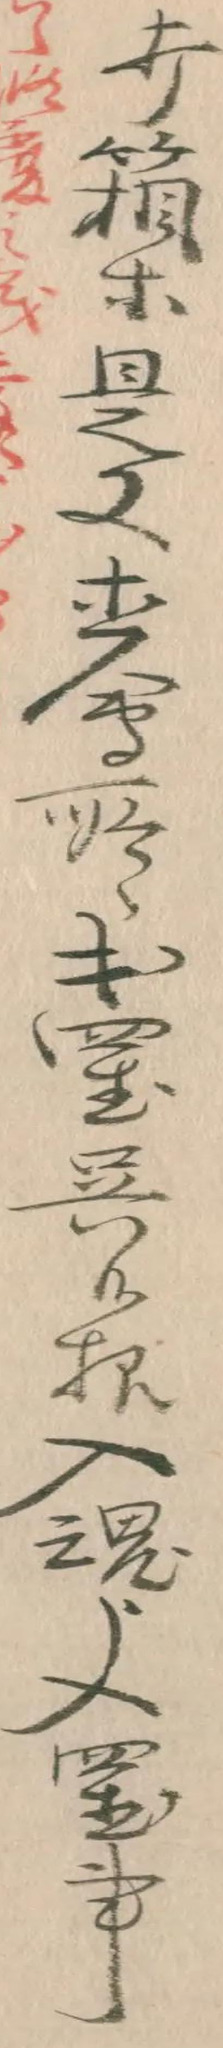打箱等是又直會所へ出置呉候様入魂申入置事
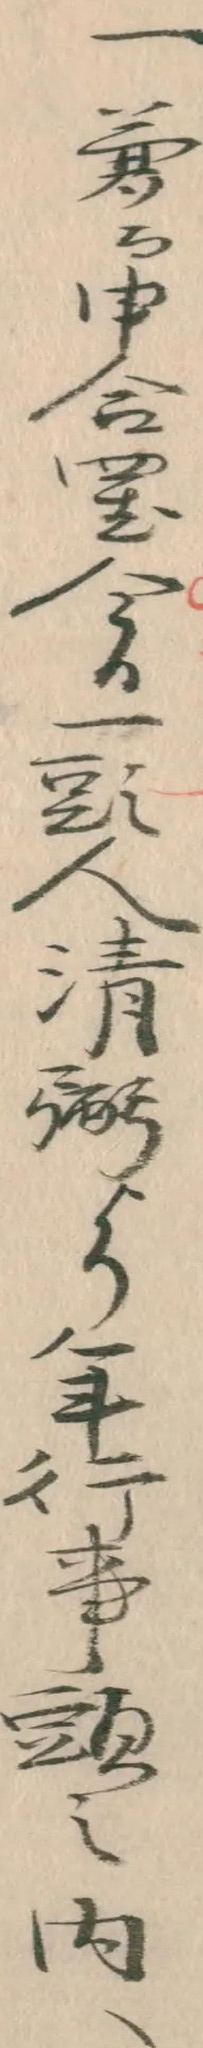一兼而申合置今日一頭人清弼より年行事頭之内へ
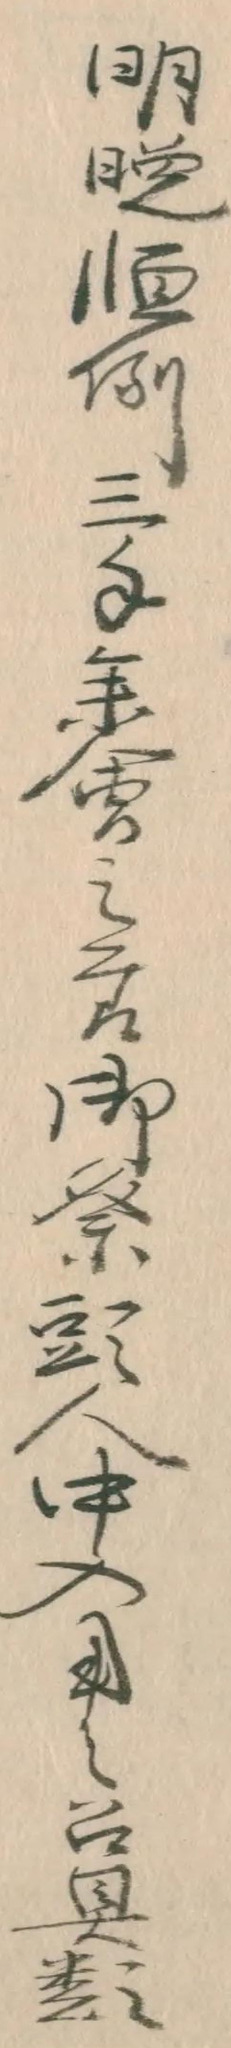明晩恒例三手参會之節御祭頭人中入用之召具類
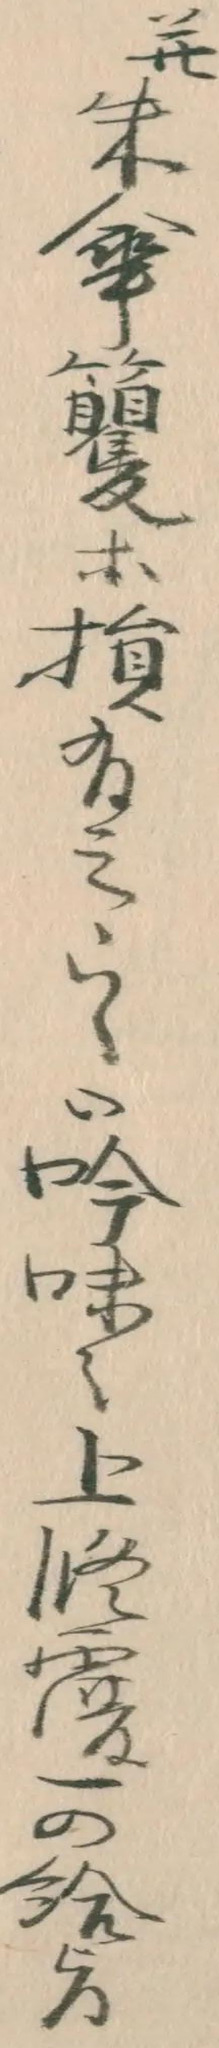幷朱傘篗等損有之候ハヽ御吟味之上修覆可給旨
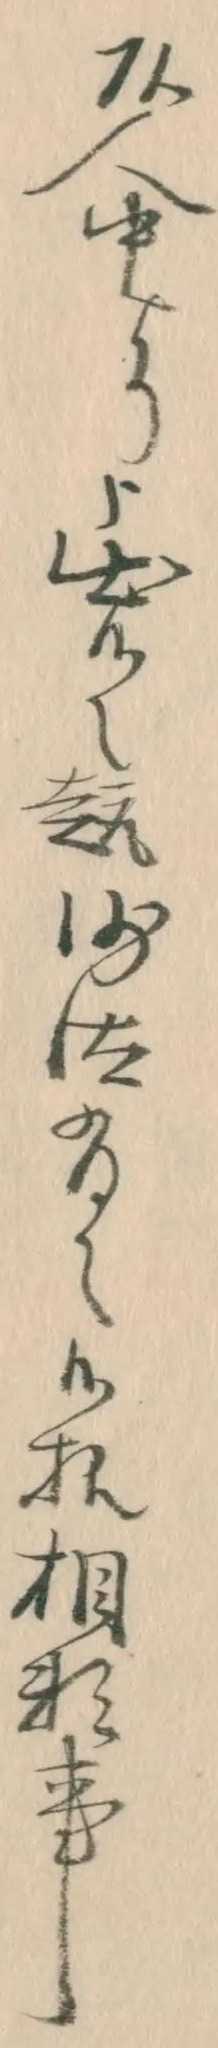頭人中より申出候之趣沙汰有之候様相頼事

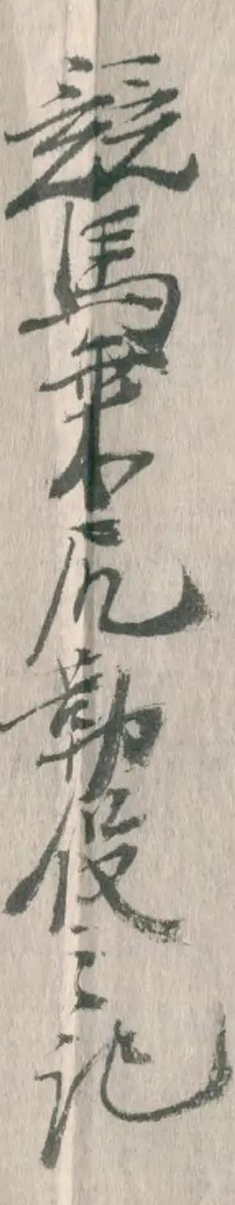競馬乗尻勤役之記
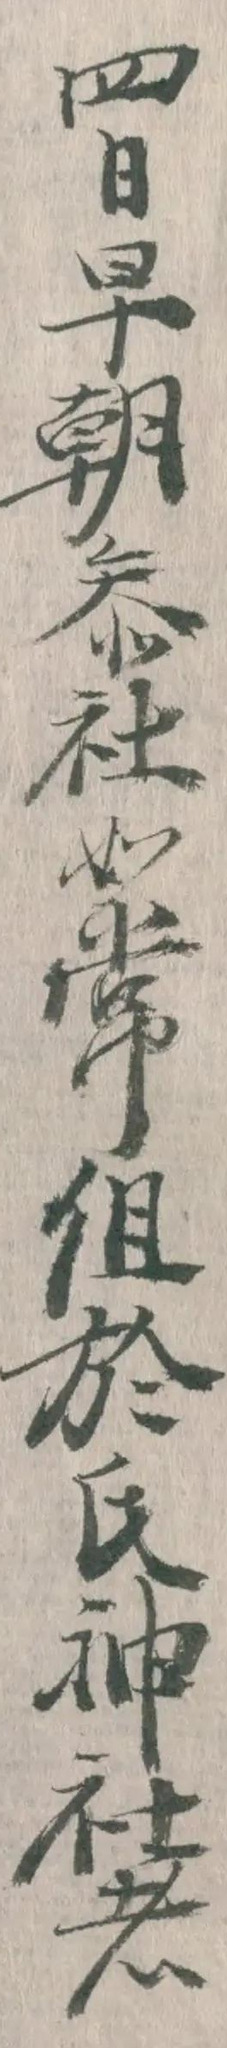四日早朝参社如常但於氏神社は
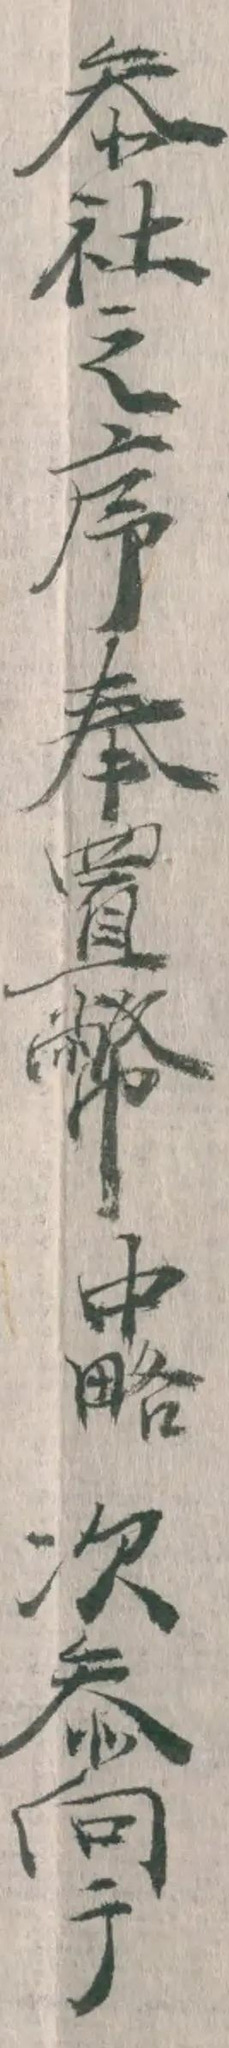参社之序奉置幣中略次参向于
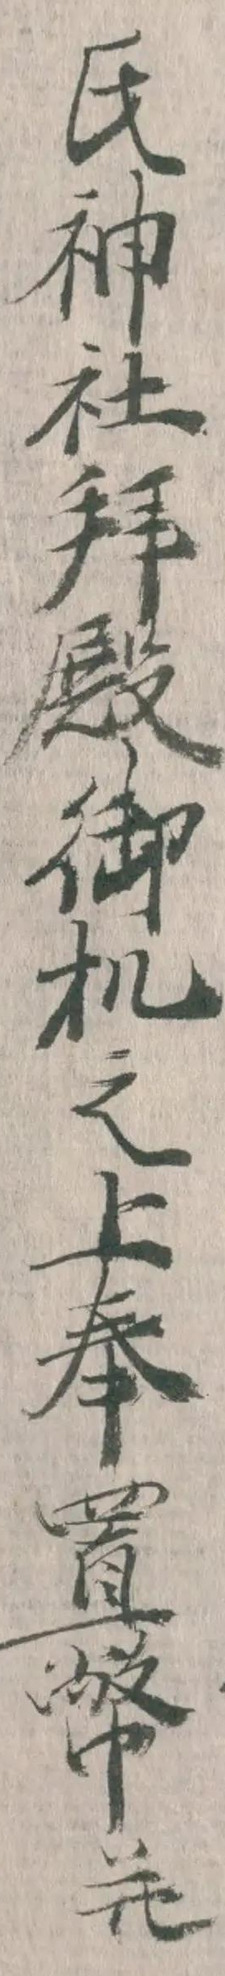氏神社拝殿御机之上奉置幣并
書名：賀茂社記録. 第72冊
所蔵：国立国会図書館 National Diet Library, JAPAN
